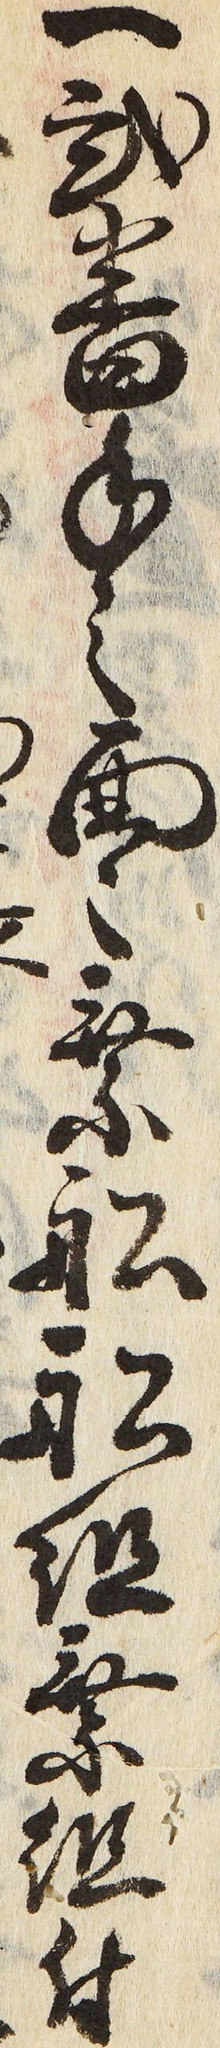一弐番手之面々乗船船組乗組付
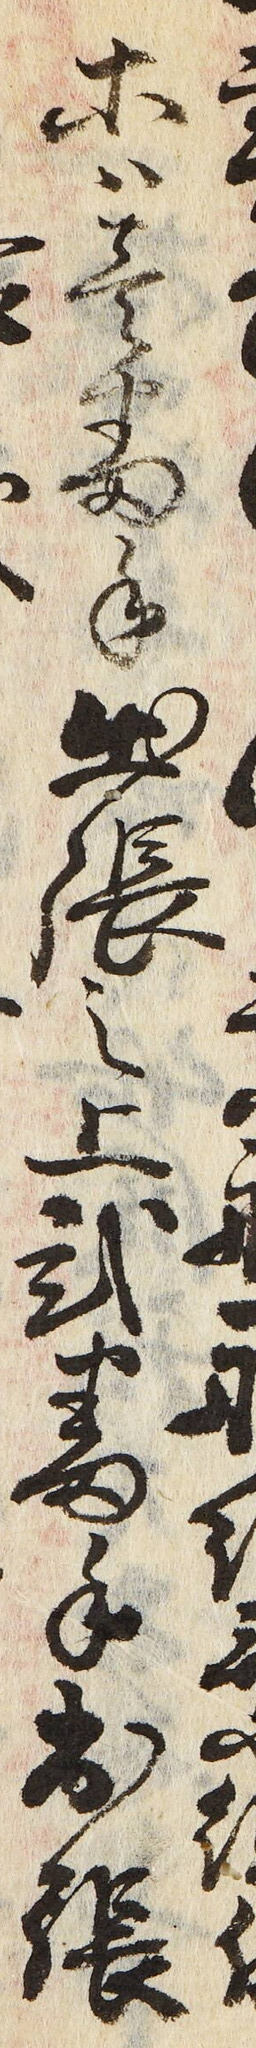等ハ壱番手出張之上弐番手出張
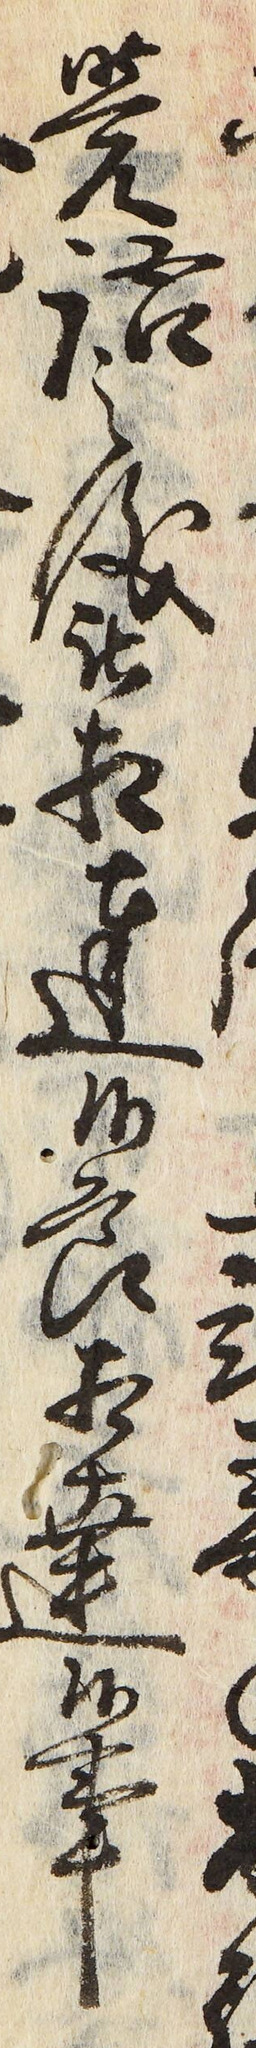覚語之儀被相達候節相達候事
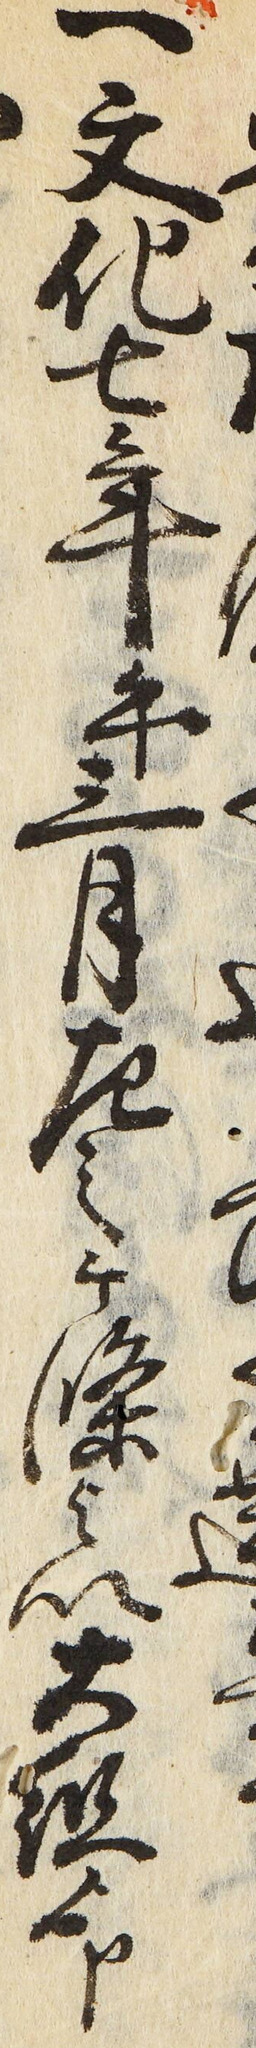一文化七年午三月左之ケ条与以大組ゟ申
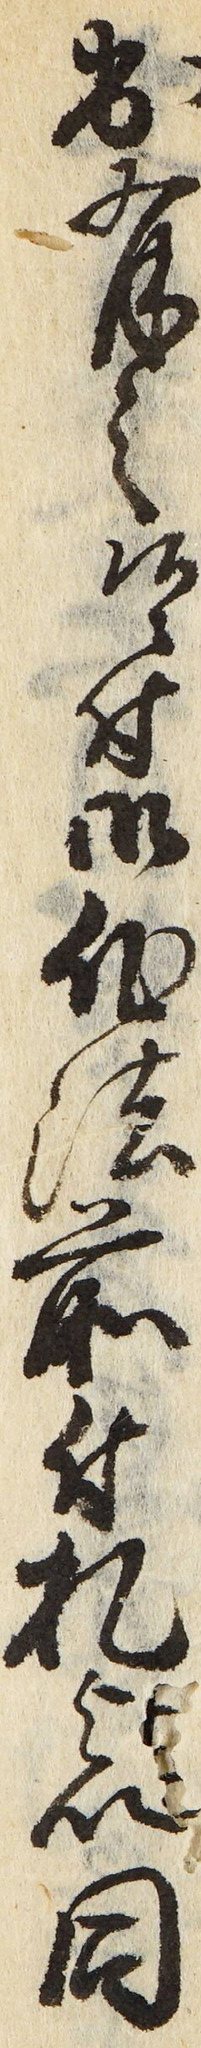出有之候ニ付作法前付札与以同

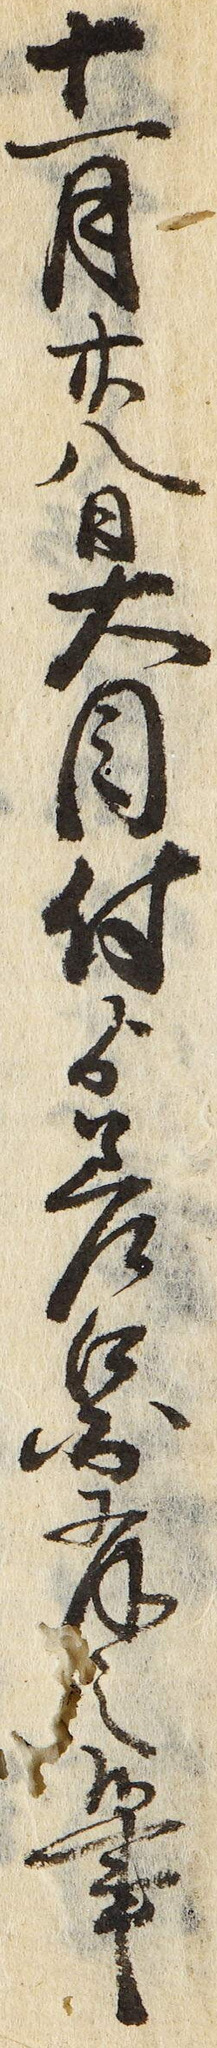十一月廿八日大目付ゟ差図有之候事
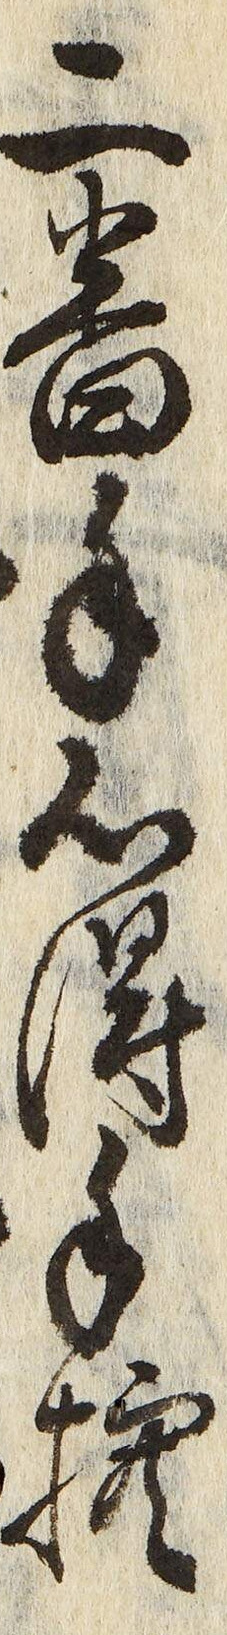二番手心得手控
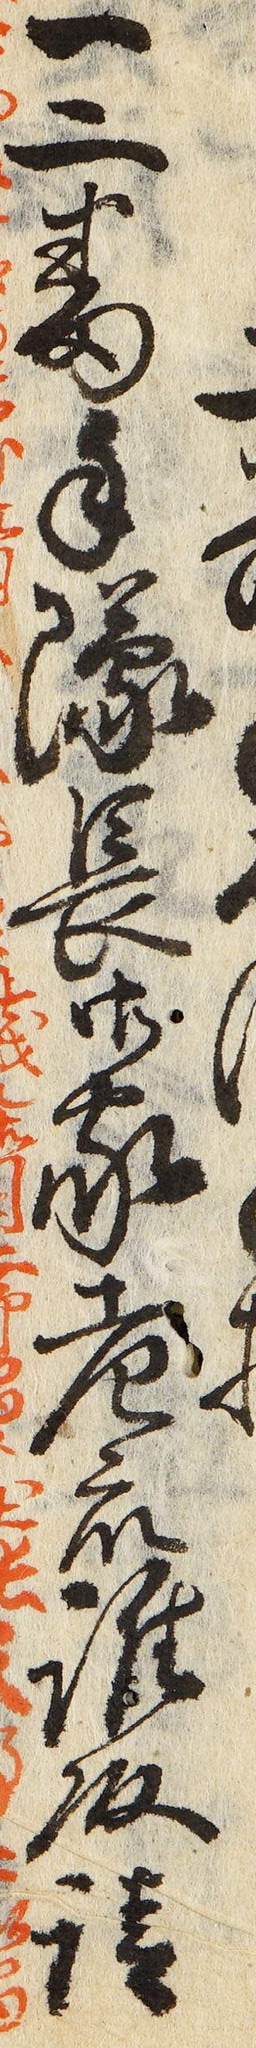一二番手隊長御家老衆誰殿請
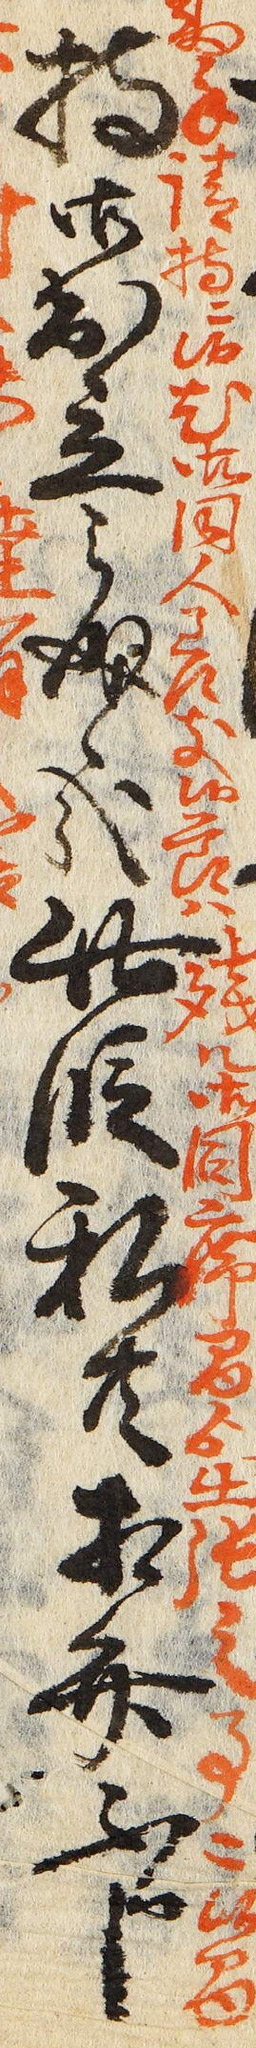持御出立被成候哉此段私共相弁不申
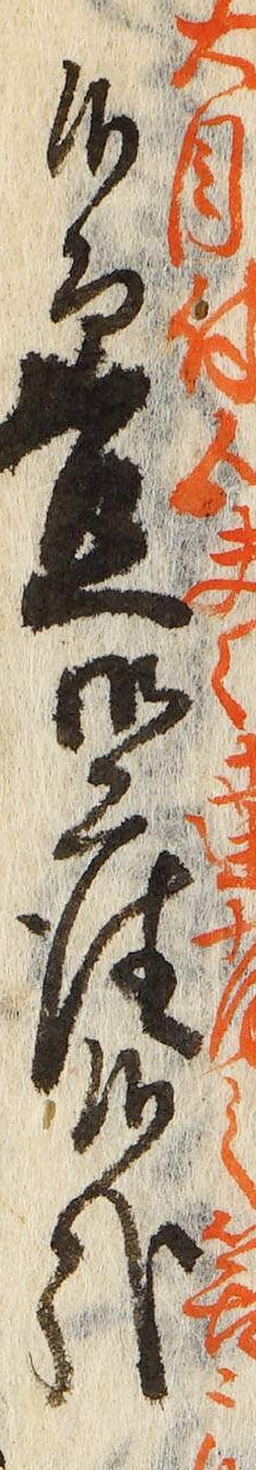候而宜御座候哉
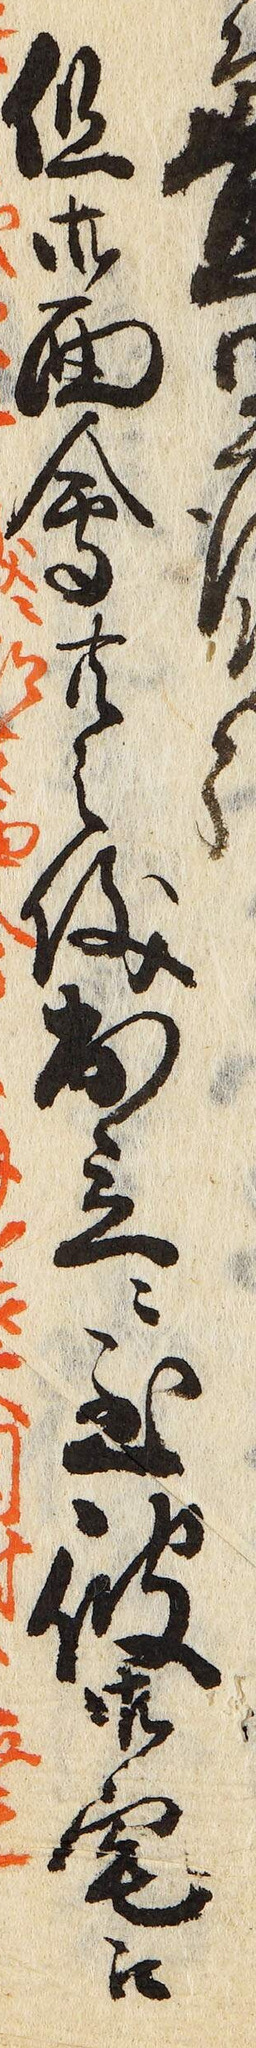但御面会共之儀出立ニ至彼御宅江
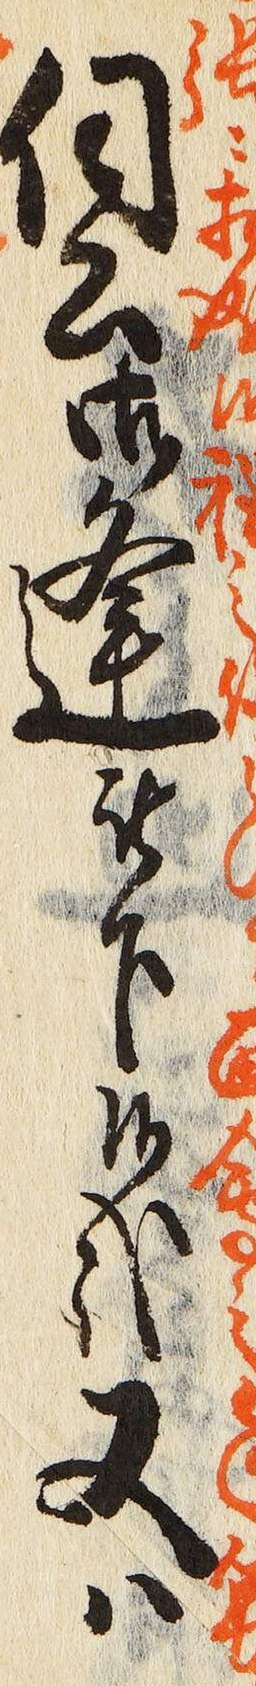伺公御逢被下候哉又ハ
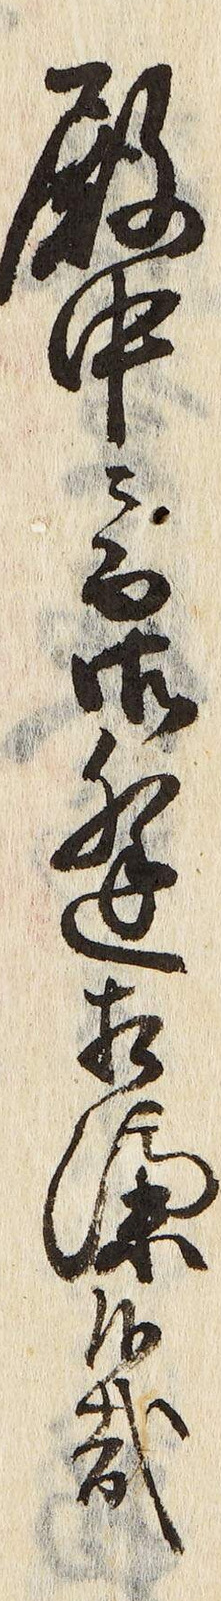殿中ニ而御逢相済候哉
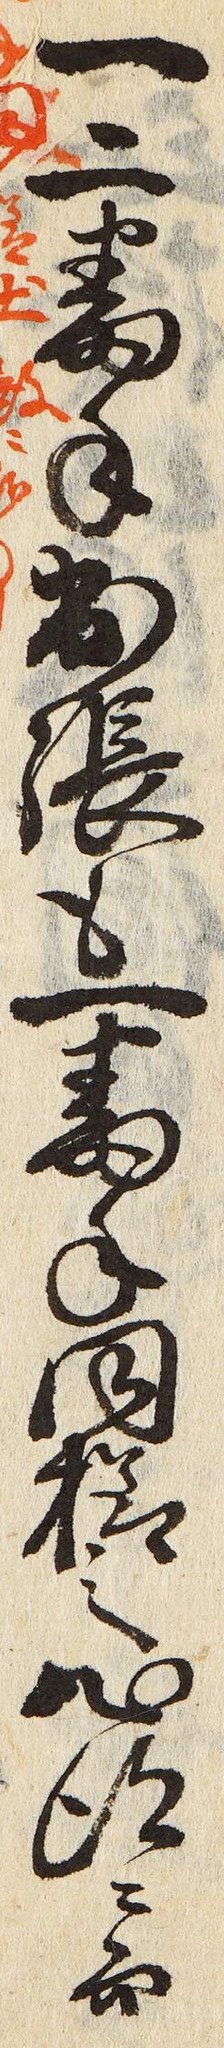一二番手出張も一番手同様之心得ニ而
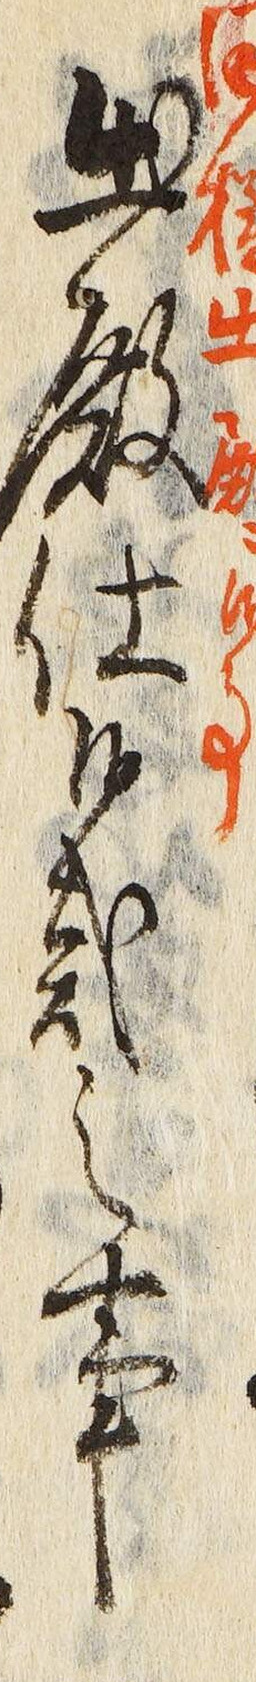出殿仕候哉之事
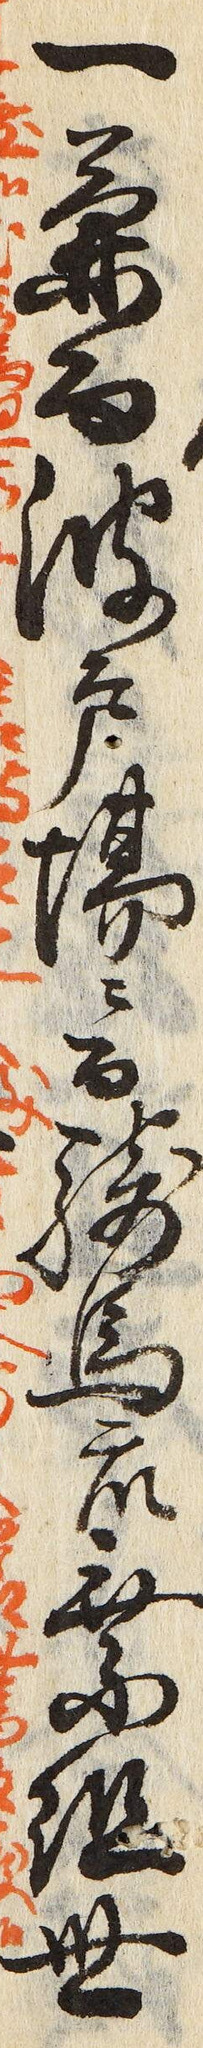一兼而波戸場ニ而騎馬衆乗組世
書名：御領海江異国船漂流有之節御手当之次第大組頭心得之廉々書集記
